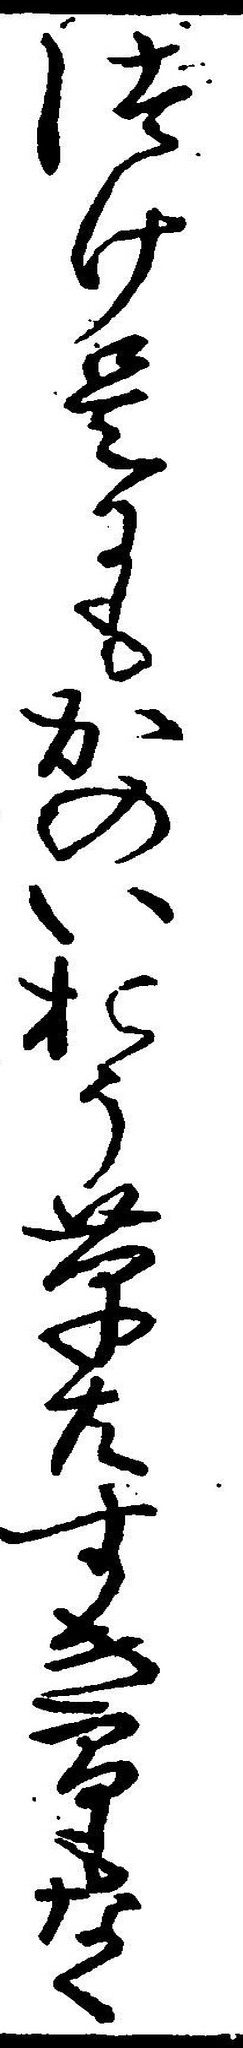つけ是にもかのいおう草共すき間もなく
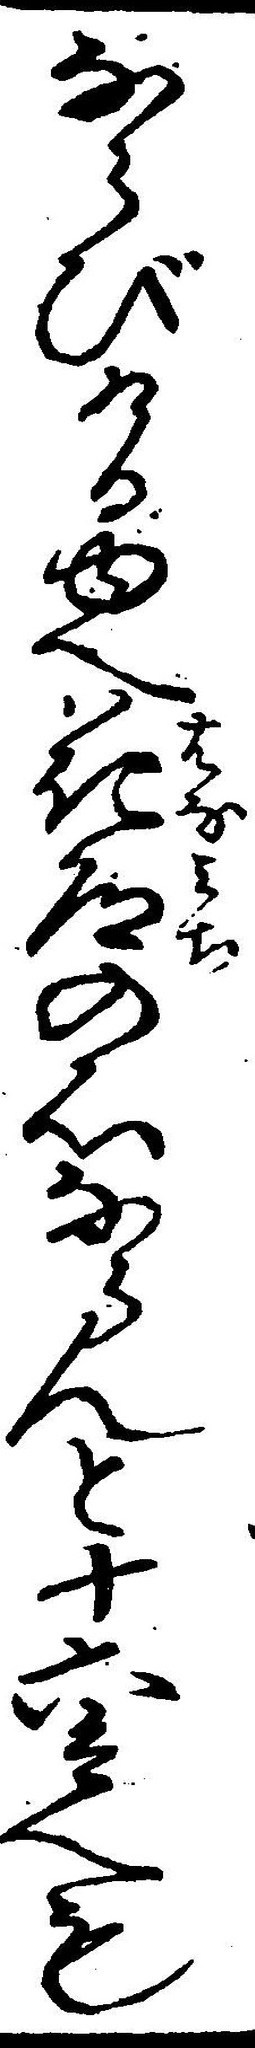ならびけるゆへ花道の心ならんと十六兵衛も

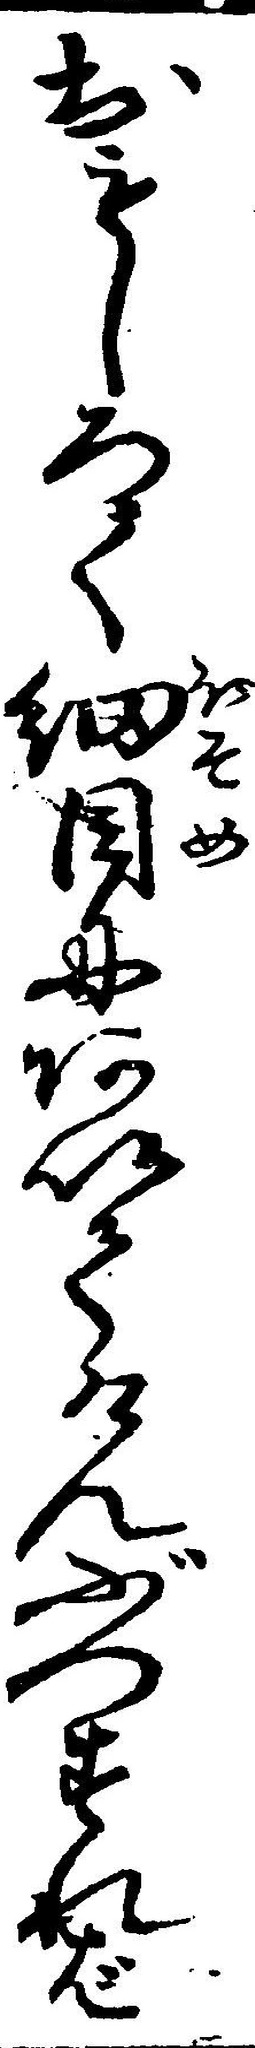おそろしく細目にあいてけんぶつすれば
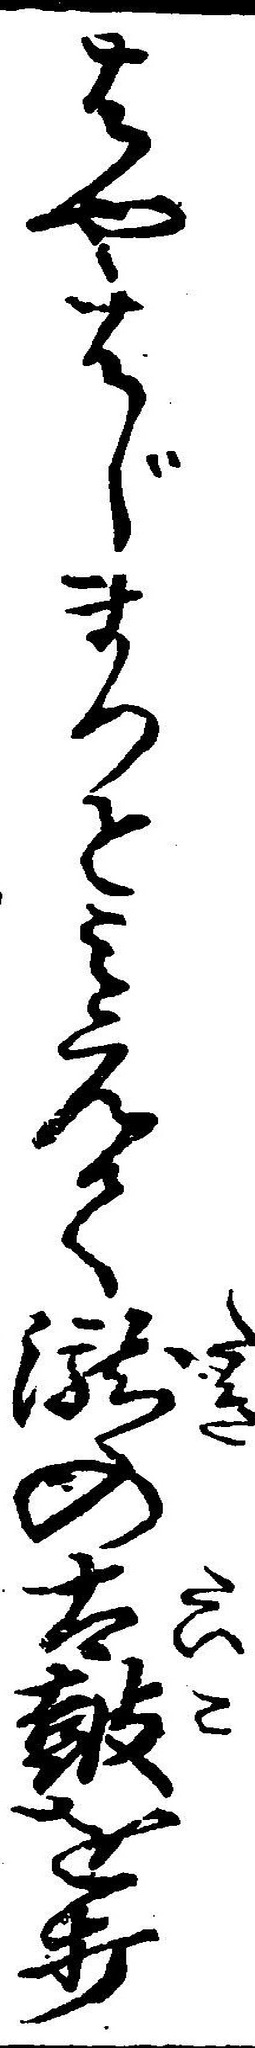はやはじまりとみえて滝の太鼓を打
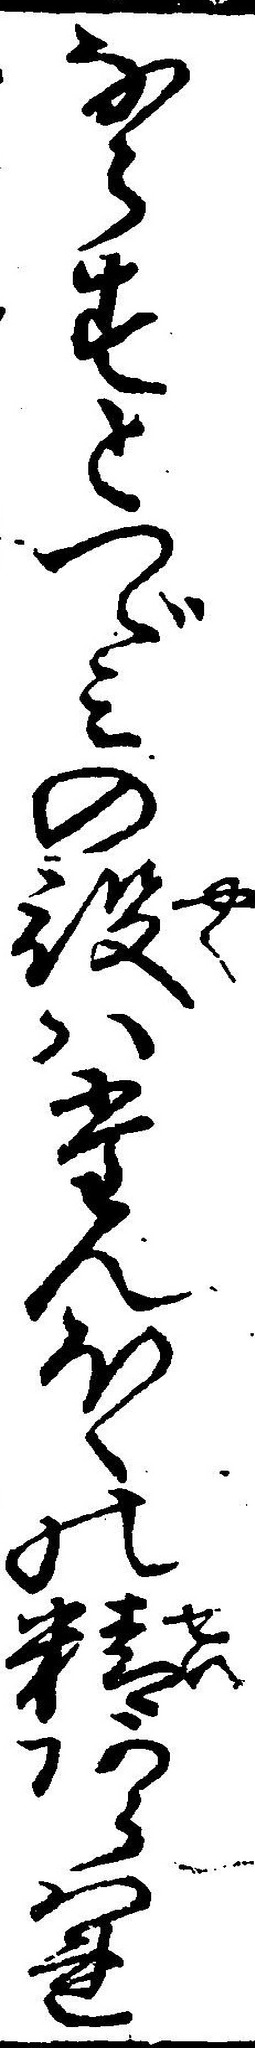ならすとつゞみの役はたんほくの精あらはれ
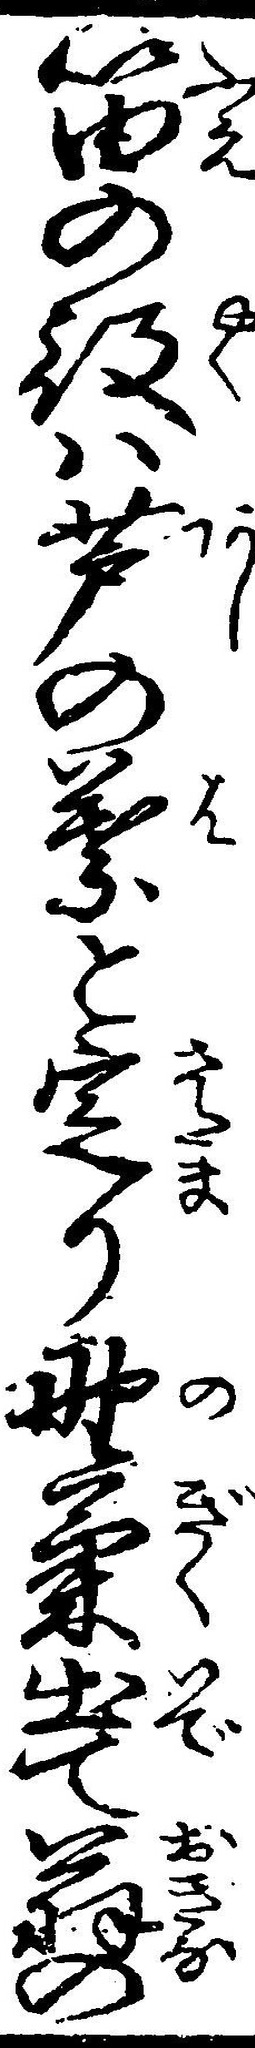笛の役は芦の葉と定り野菊出て翁の
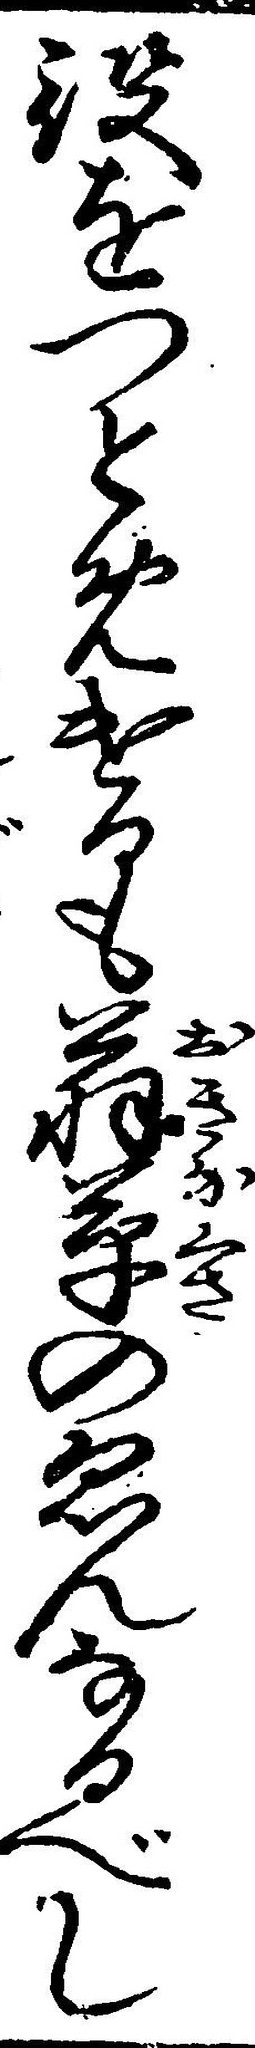役をつとめけるも翁草のゑんなるべし
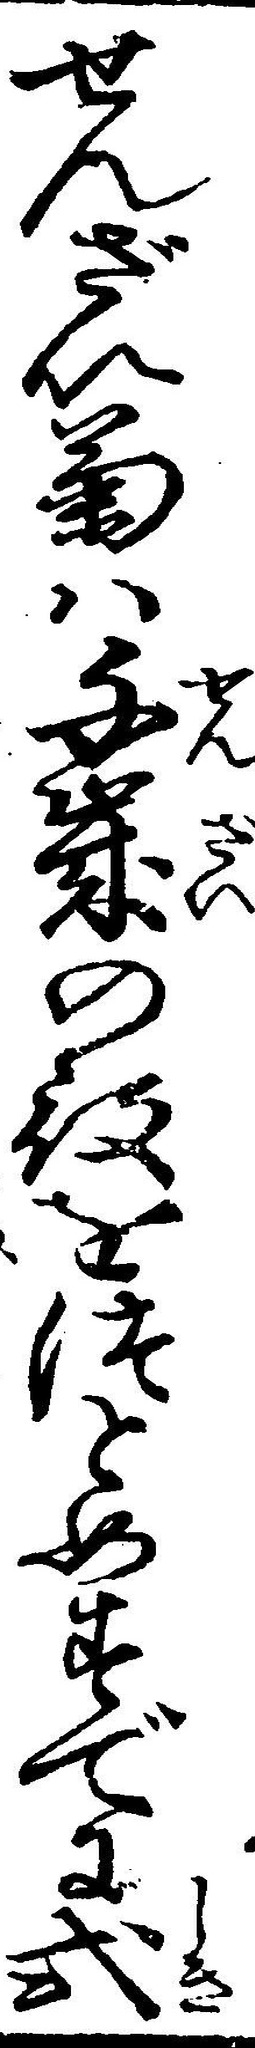せんざい菊は千歳の役をつとめすでに式
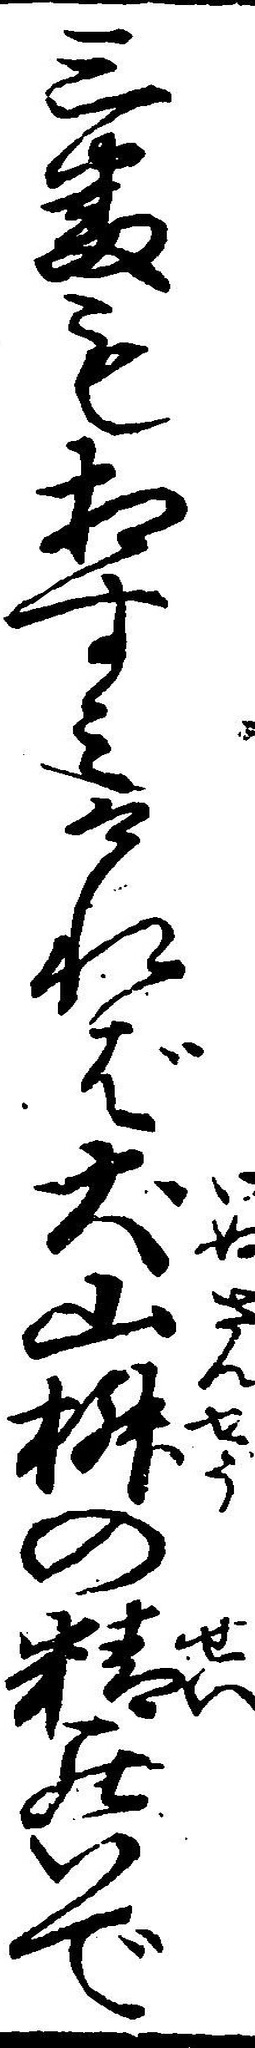三番も相すみければ犬山椒の精罷いで
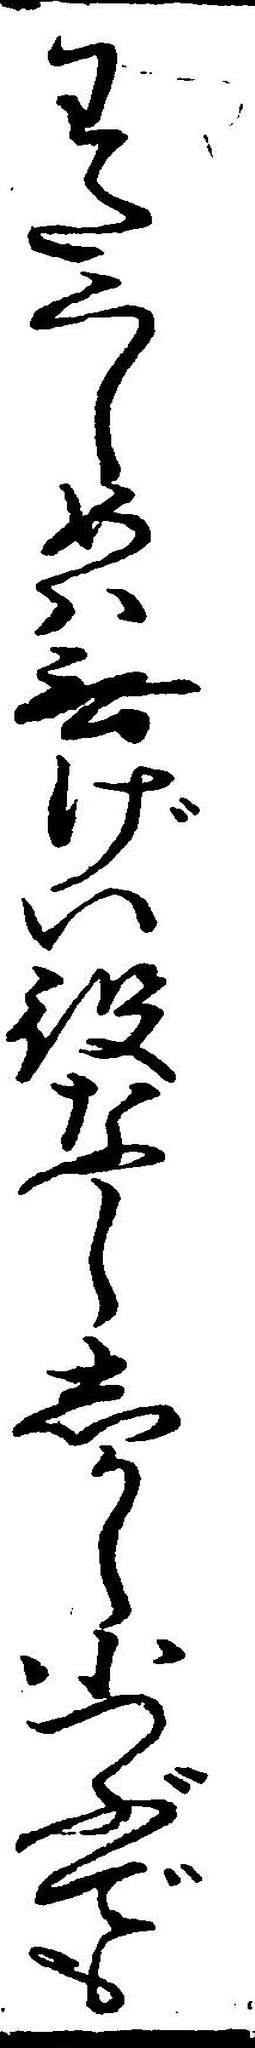わたくしめは無げい役なししかし小つぶでも
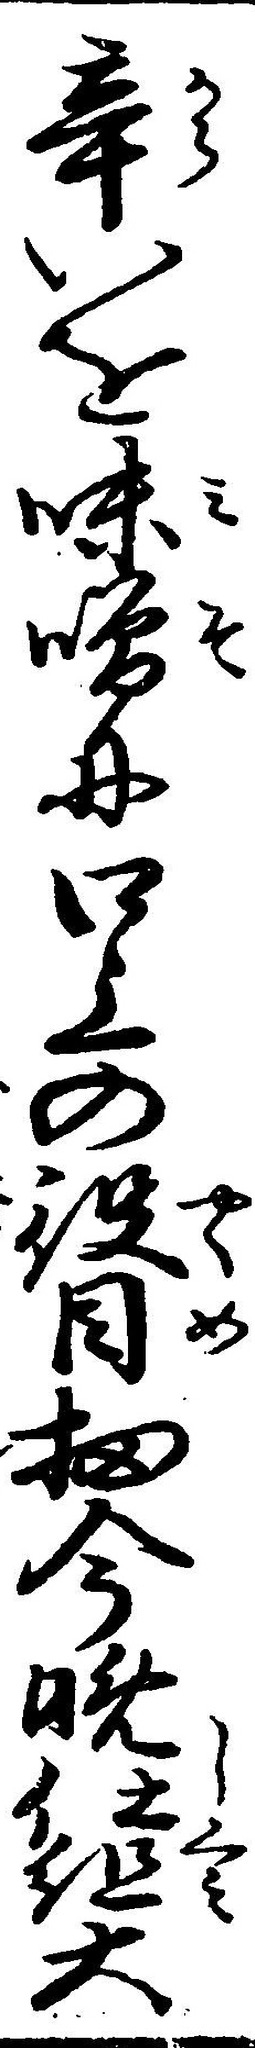辛を味噌に口上の役目扨今晩仕組大
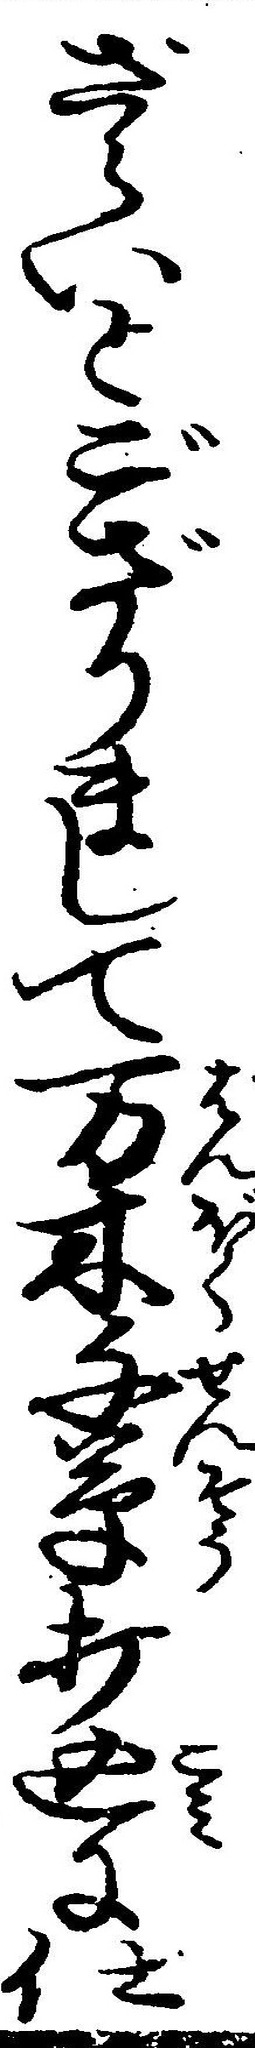ざらいとござりまして万木千草打込に仕
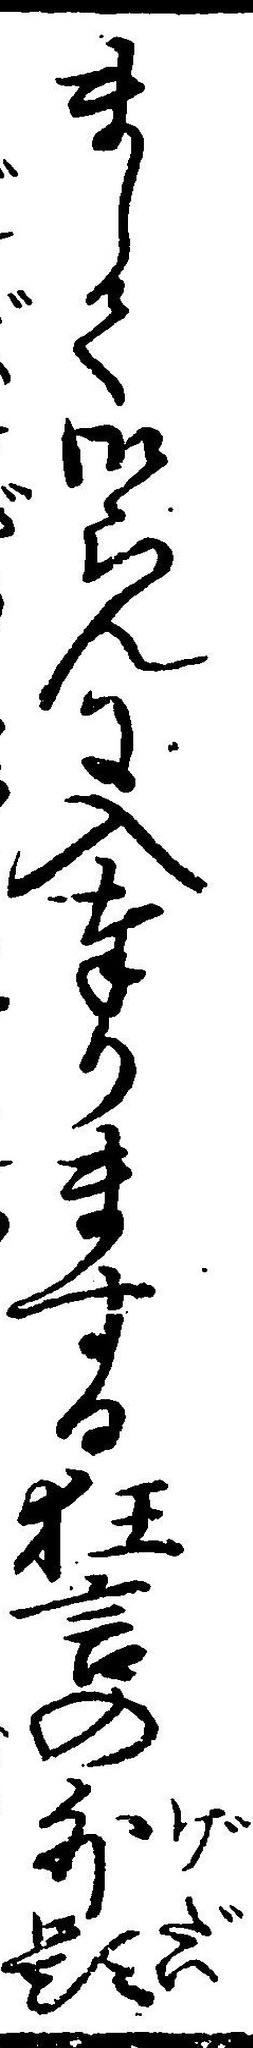まして御らんに入奉りまする狂言の外題
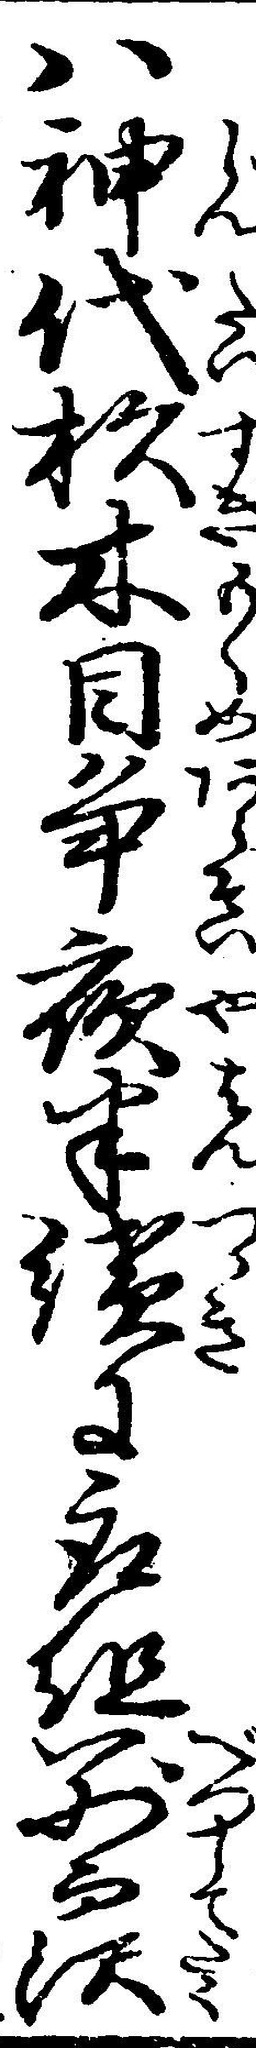は神代杉木目争夜半続に取組別而沢
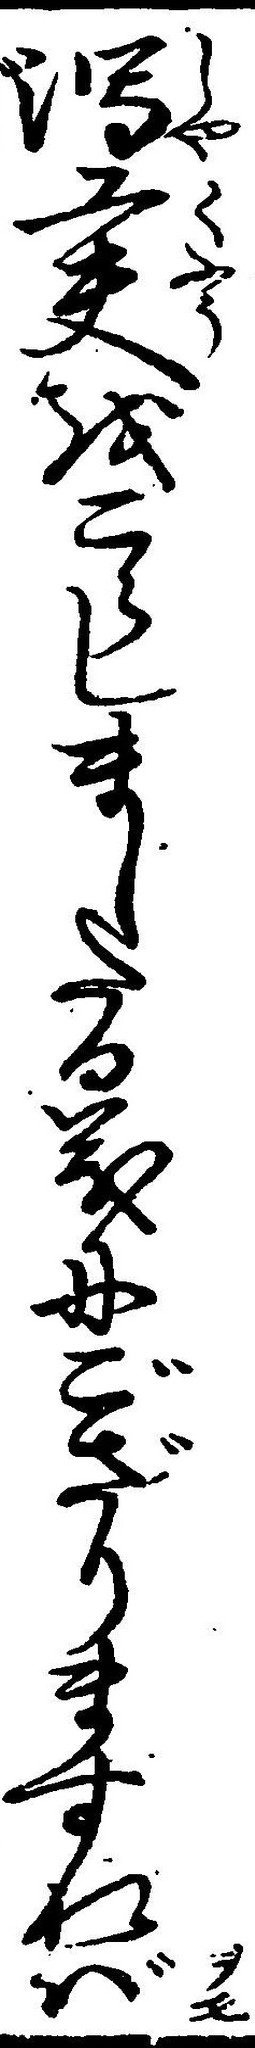瀉工夫をこらしましたる義にござりますれば
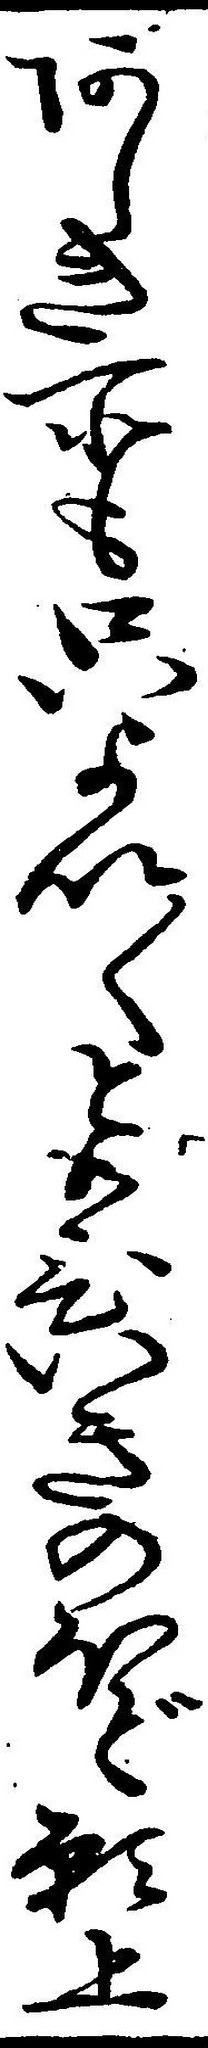あしき所も只よい〳〵と御心いきのほど願上
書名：草木芝居化物退治 / 泉花堂三蝶(十六兵衛)作
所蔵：東京大学総合図書館 General Library in the University of Tokyo, JAPAN
